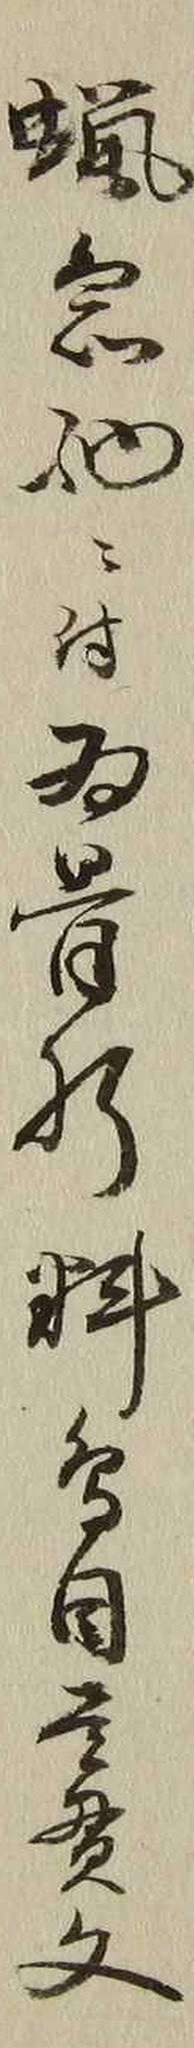蝋急納ニ付為骨折料鳥目壱貫文
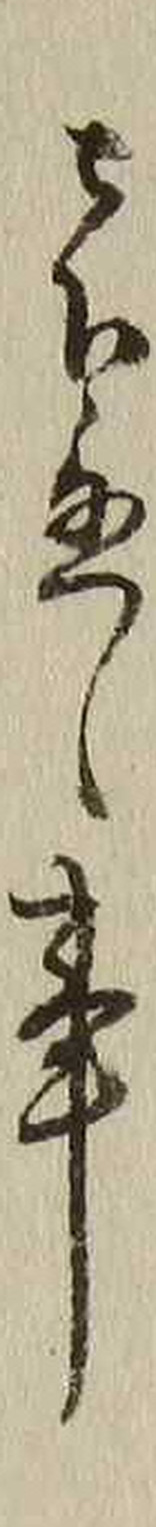被下置候事
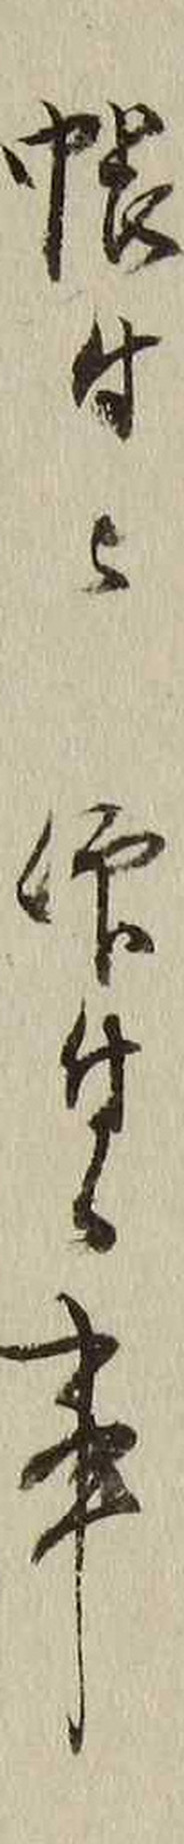帳付被仰付候事
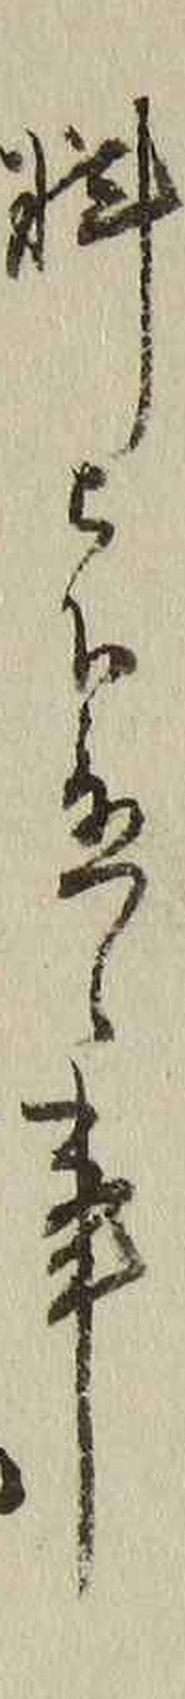被下置候事
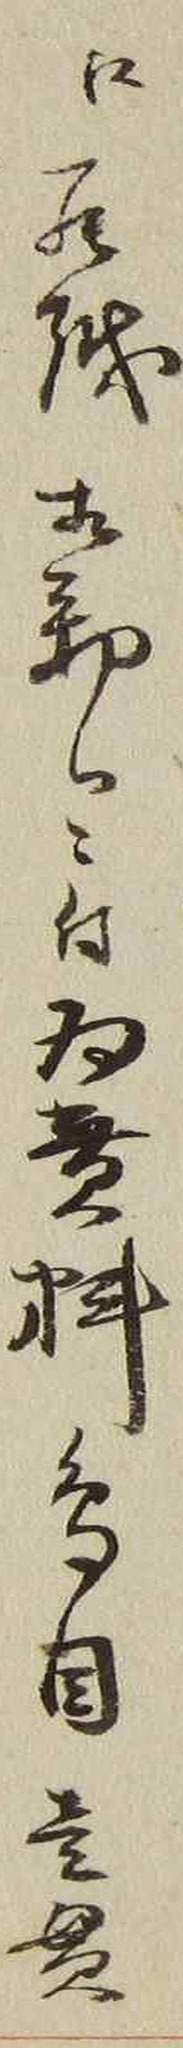に罷越相勤候ニ付為費料鳥目壱貫
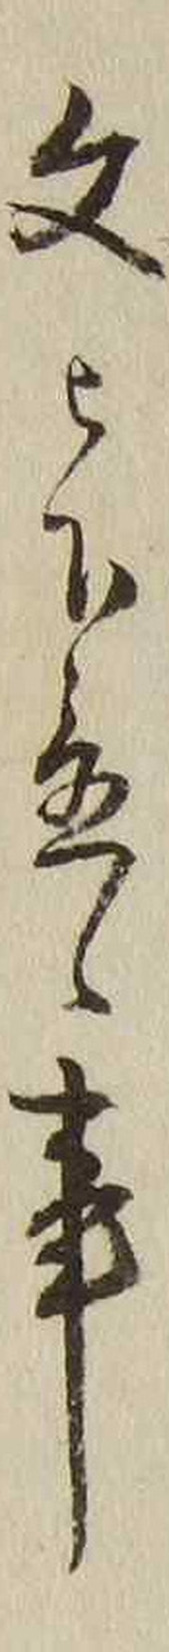文被下置候事

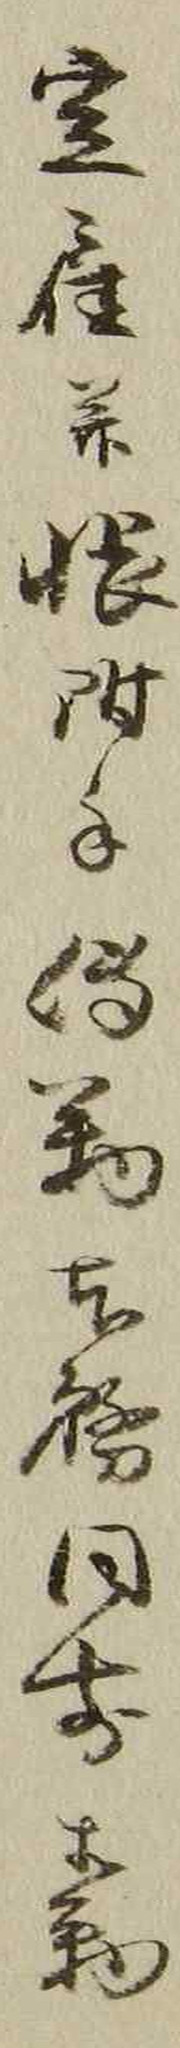定雇并帳附手伝勤本務同前相勤
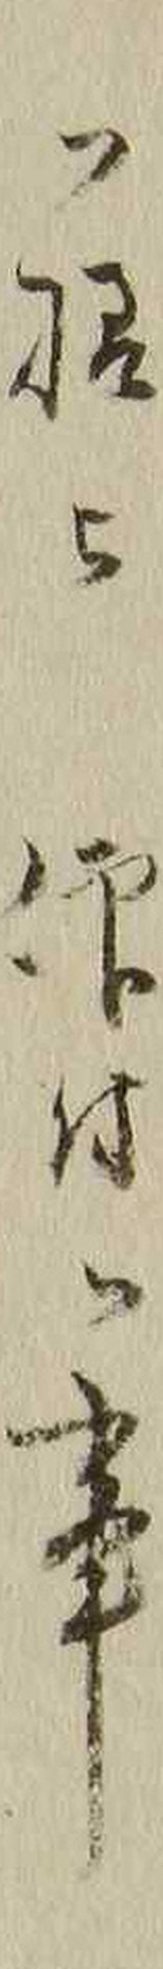候様被仰付候事
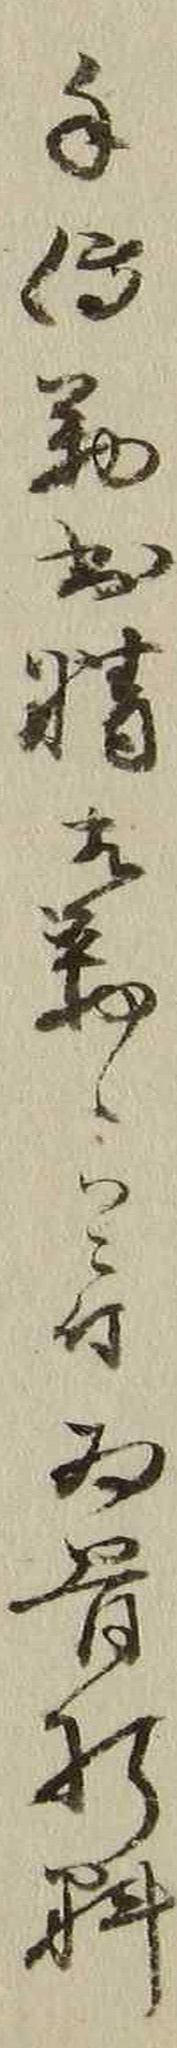手伝勤出精相勤候ニ付為骨折料
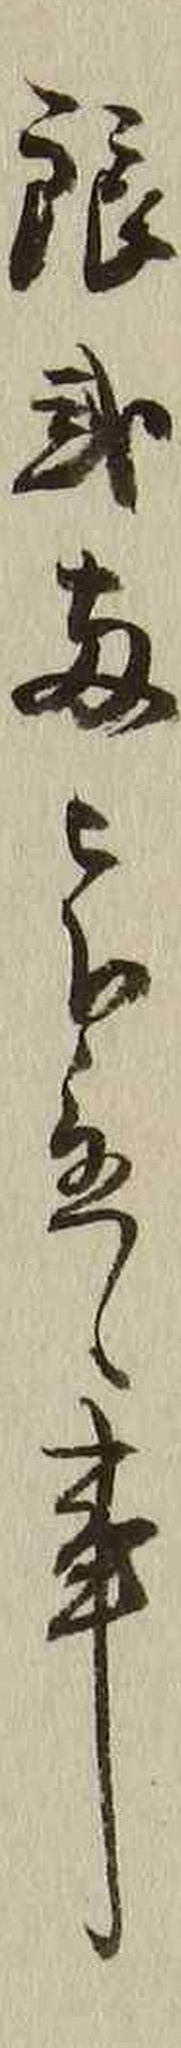銀弐両被下置候事
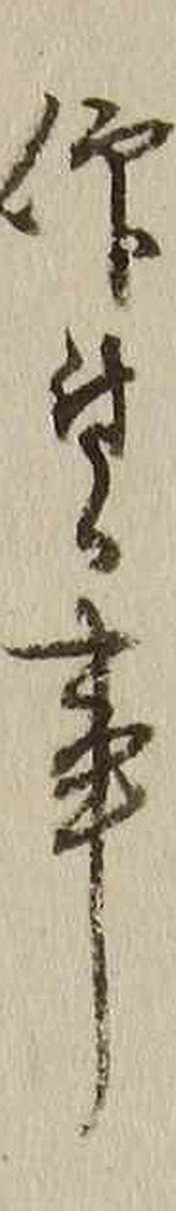仰付候事
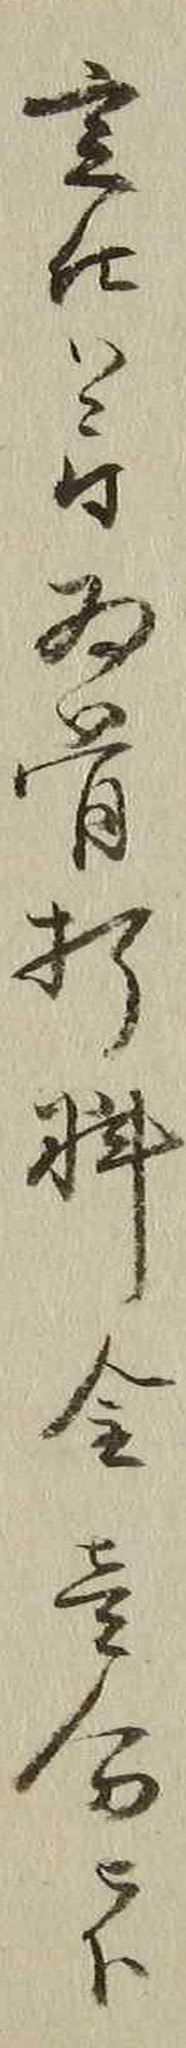定仕候ニ付為骨折料金壱分被下
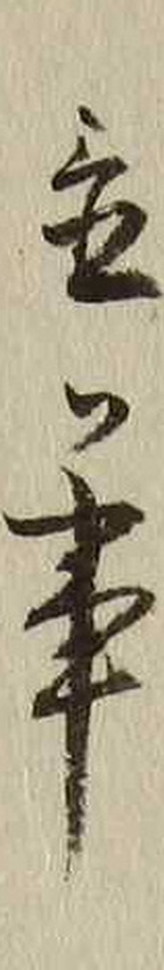置候事
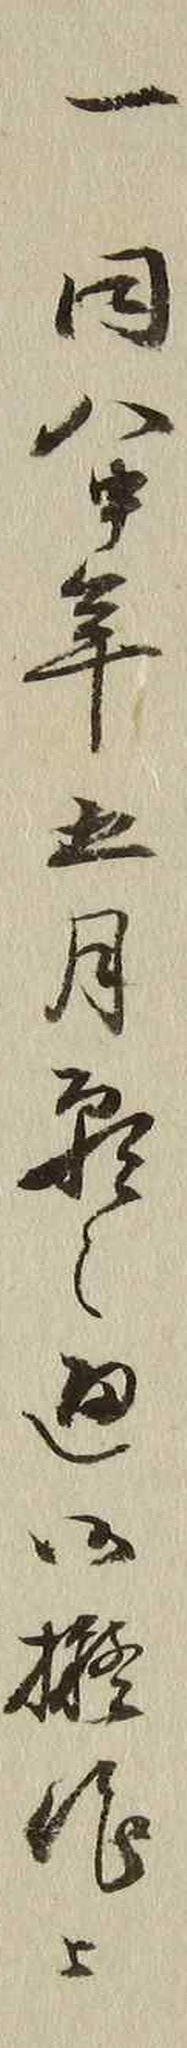一同八申年五月願之通御擬作被
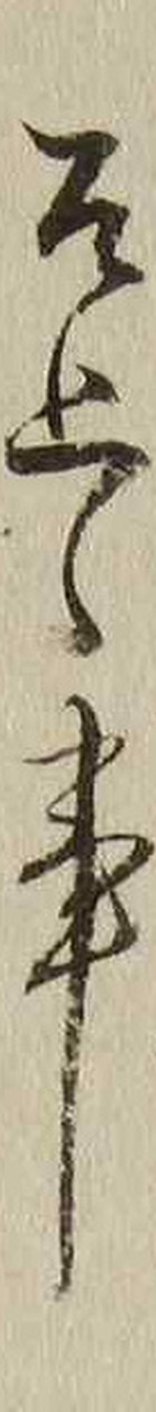召上候事
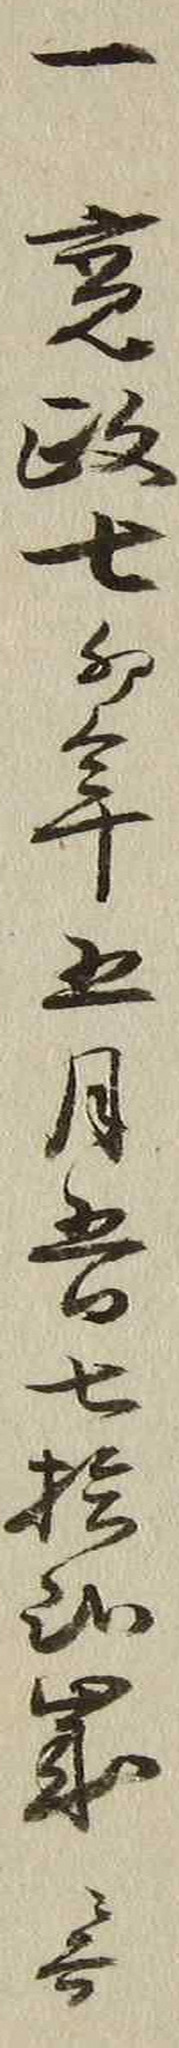一寛政七卯年五月五日七拾弐歳ニ而
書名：諸士系譜　巻之236　ふ之部4
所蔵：会津若松市立会津図書館
